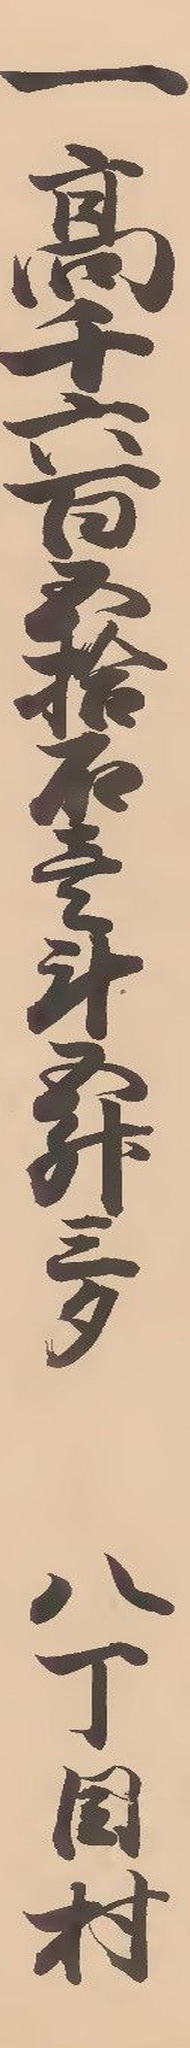一高千六百五拾石壱斗五升三勺八丁目村
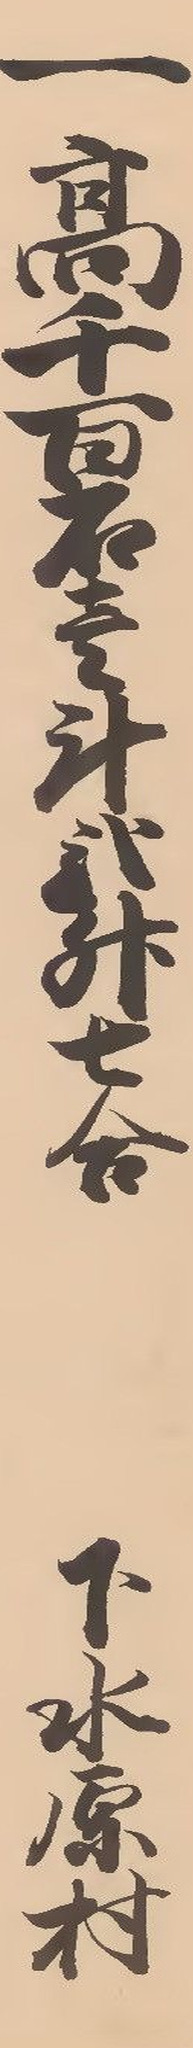一高千百石壱斗弐升七合下水原村
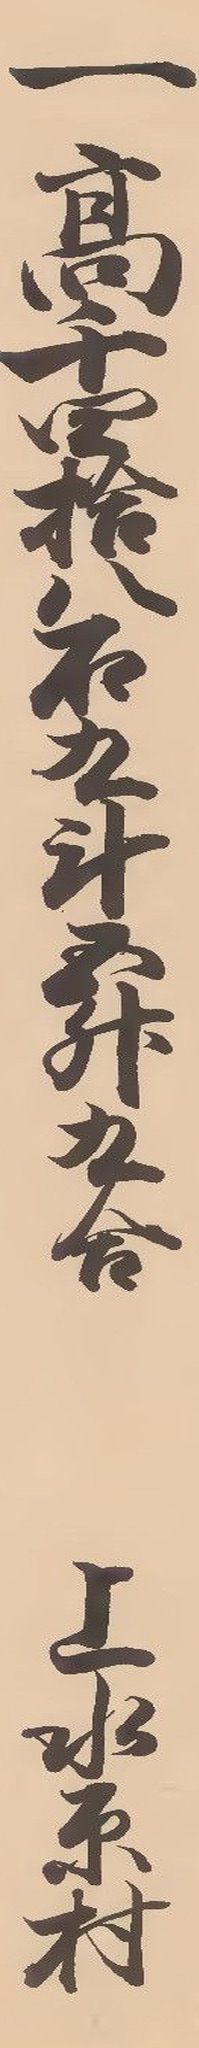一高千四拾八石九斗五升九合上水原村
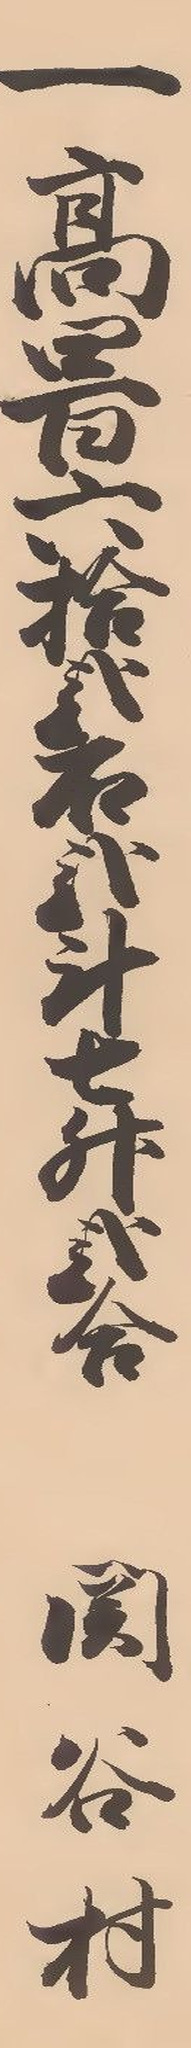一高四百六拾弐石弐斗七升弐合関谷村

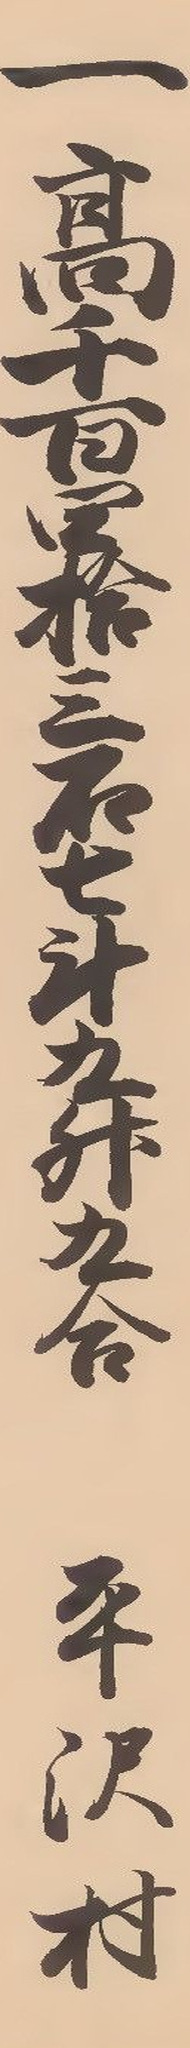一高千百四拾三石七斗九升九合平沢村
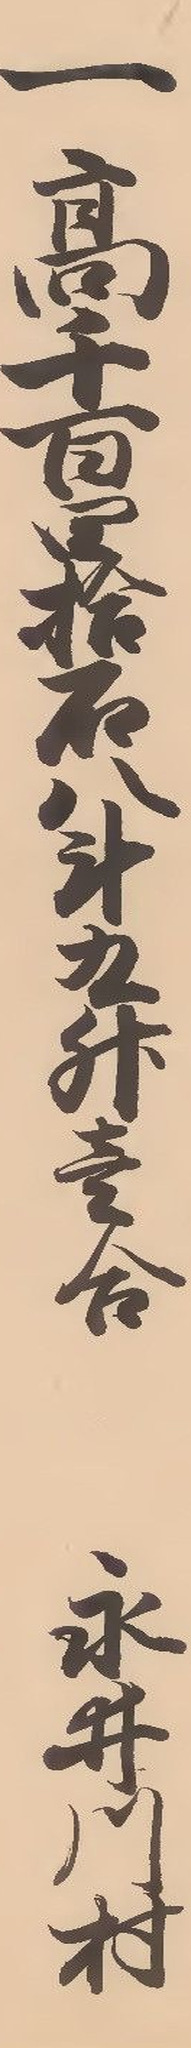一高千百四拾石八斗九升壱合永井川村
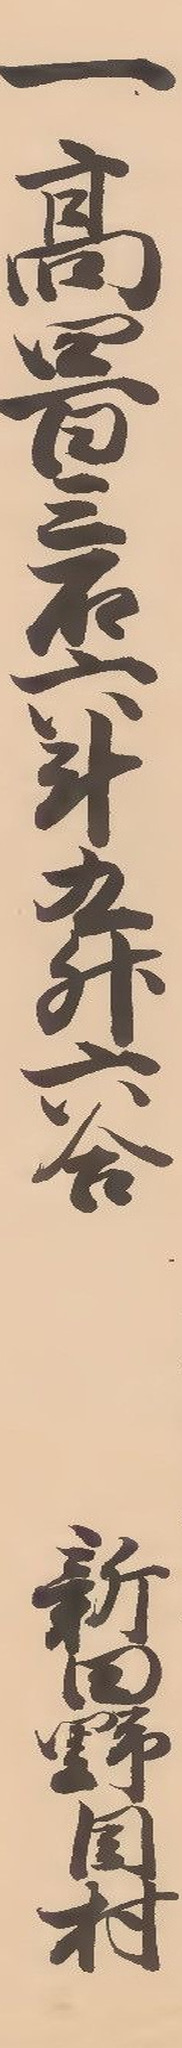一高四百三石六斗九升六合新田野目村
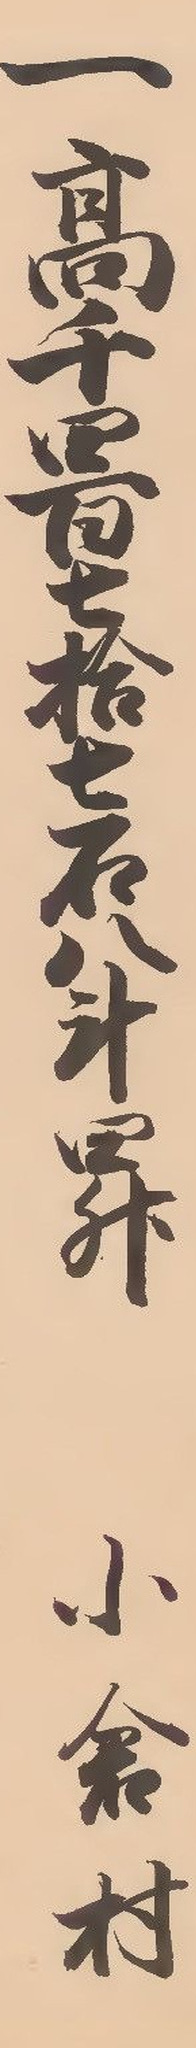一高千四百七拾七石八斗四升小倉村
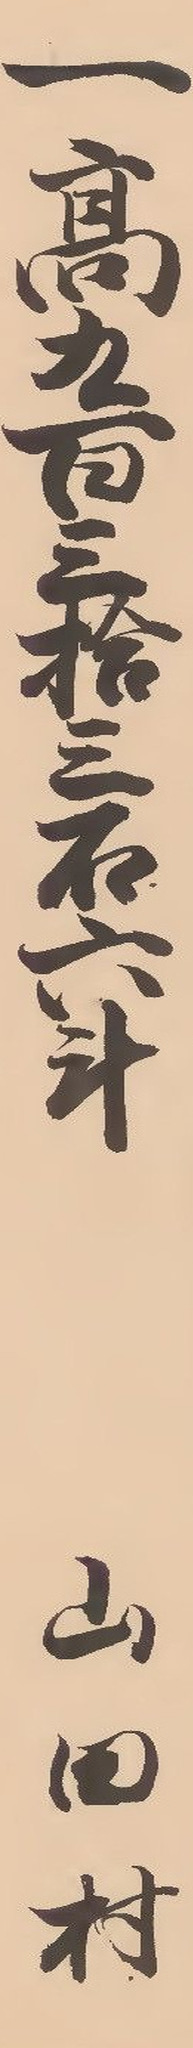一高九百三拾三石六斗山田村
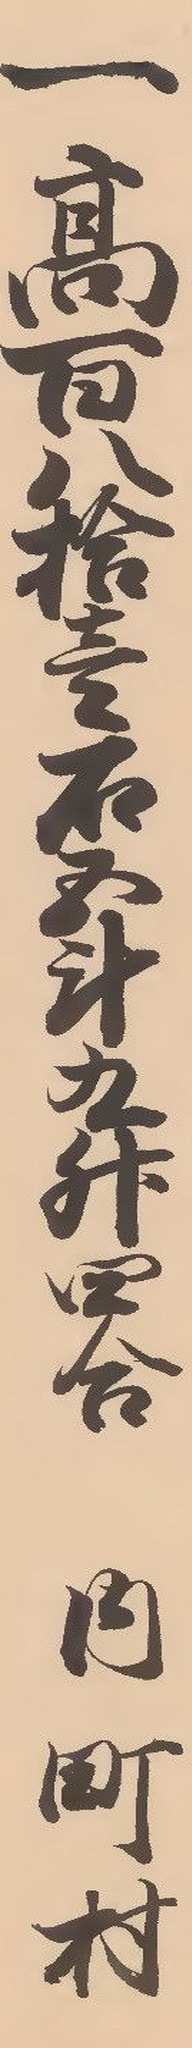一高百八拾壱石五斗九升四合内町村
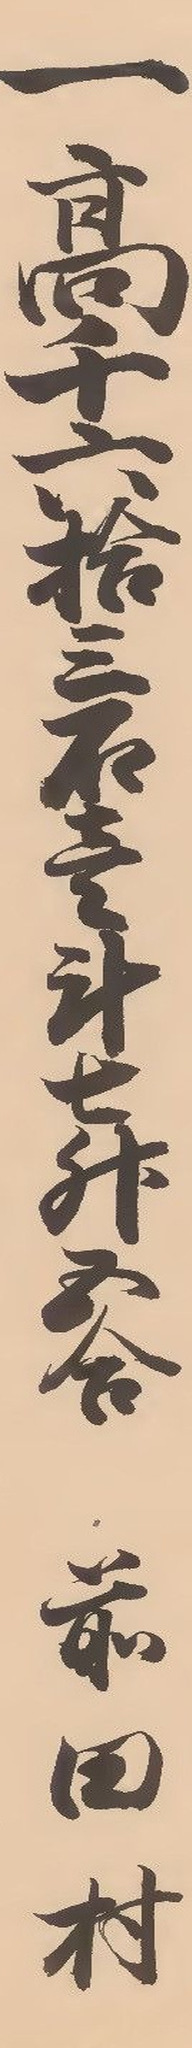一高千六拾三石壱斗七升五合前田村
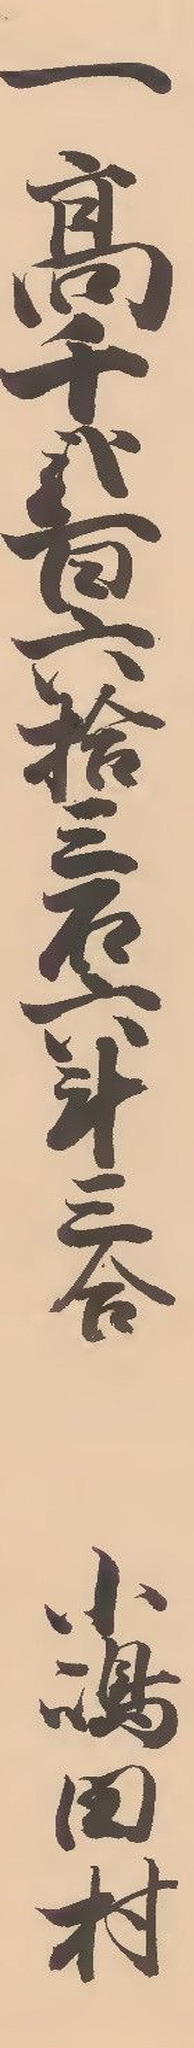一高千弐百六拾三石六斗三合小島田村

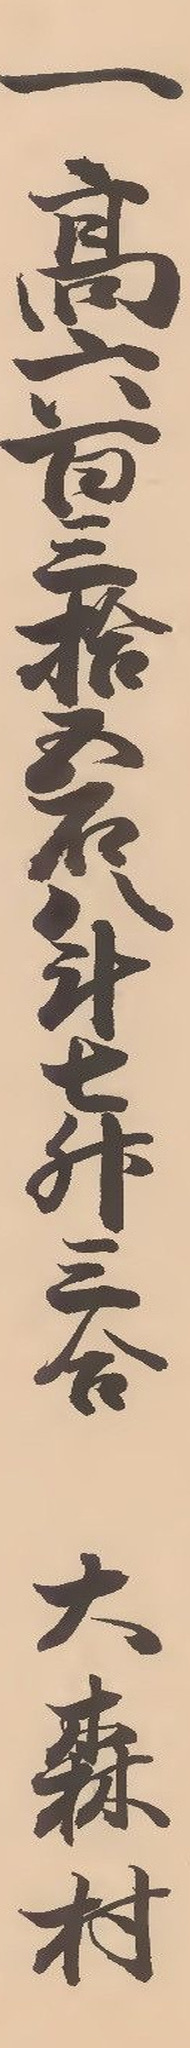一高六百三拾五石八斗七升三合大森村
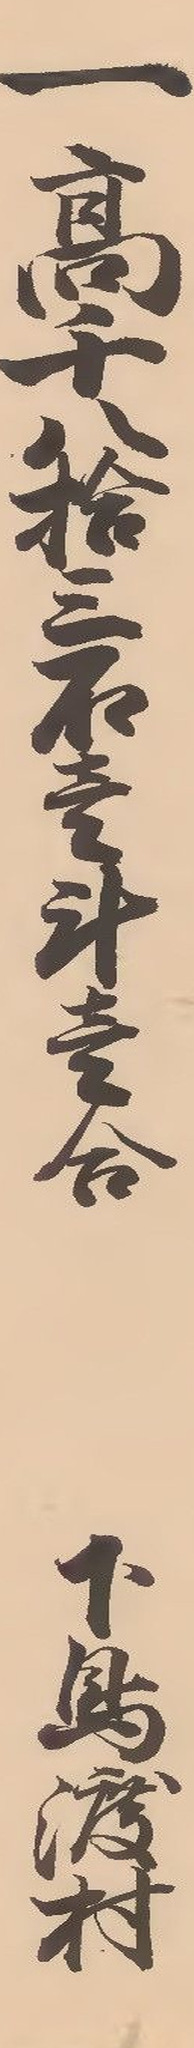一高千八拾三石壱斗壱合下鳥渡村
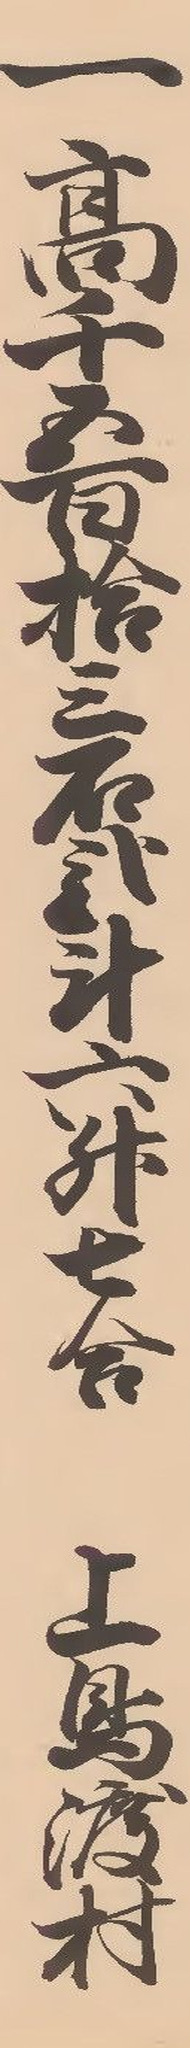一高千五百拾三石弐斗六升七合上鳥渡村
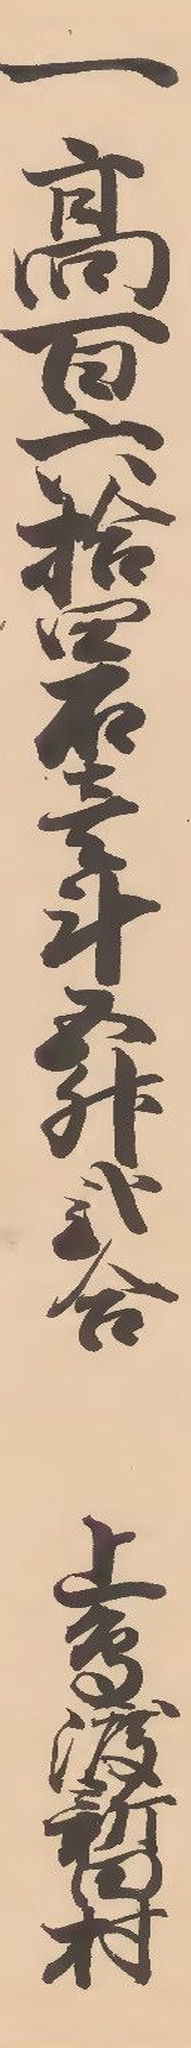一高百六拾四石壱斗五升弐合上鳥渡新田村
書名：陸奥国郷帳　４
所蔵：国立公文書館 National Archives of Japan
